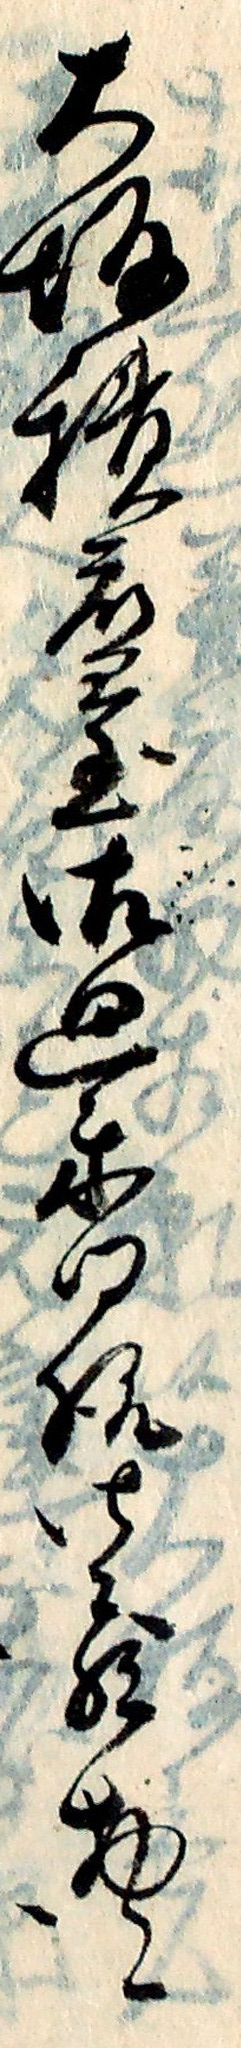大坂積藍玉御廻米同様御蔵物に
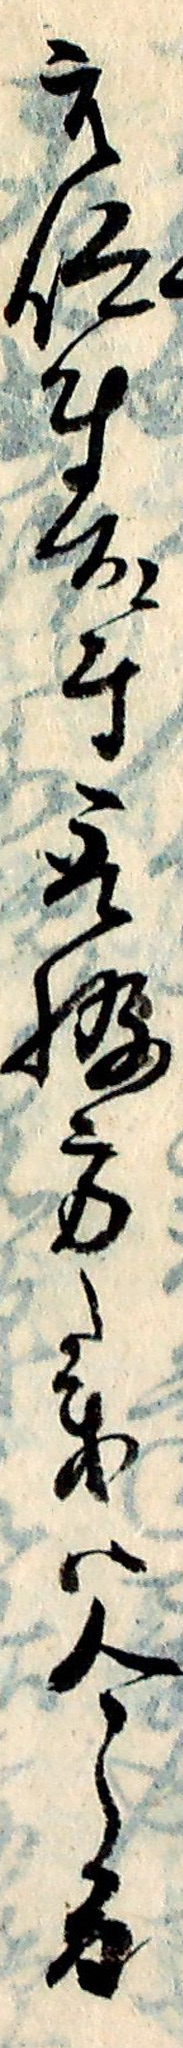被仰付候に付取扱方之義は今度
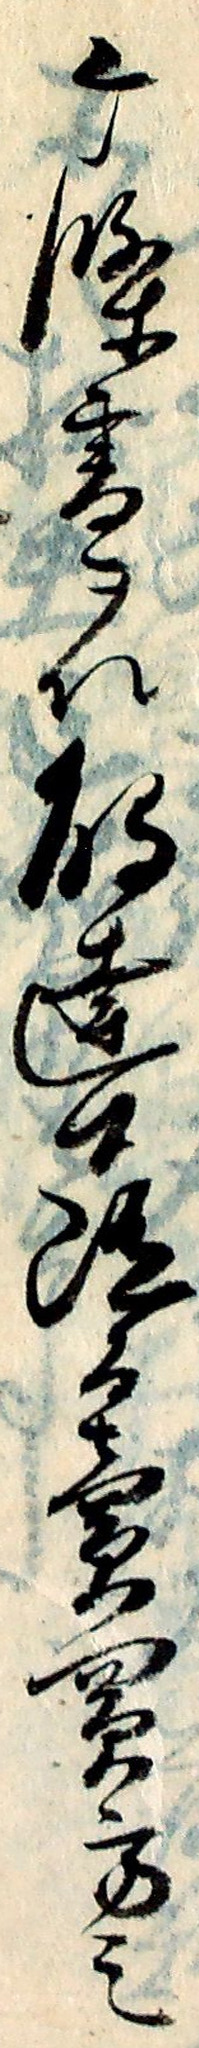ケ条書を以触達候随て売買方之
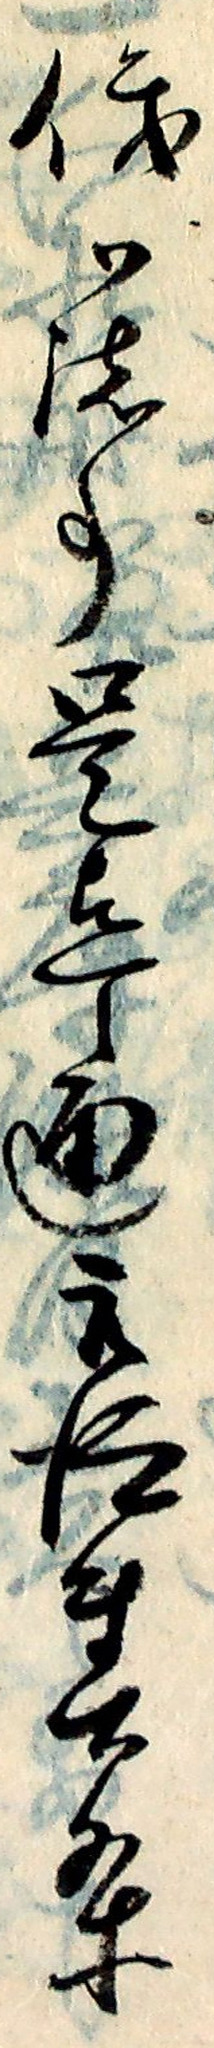儀わ諸事是迄之通被仰付候条
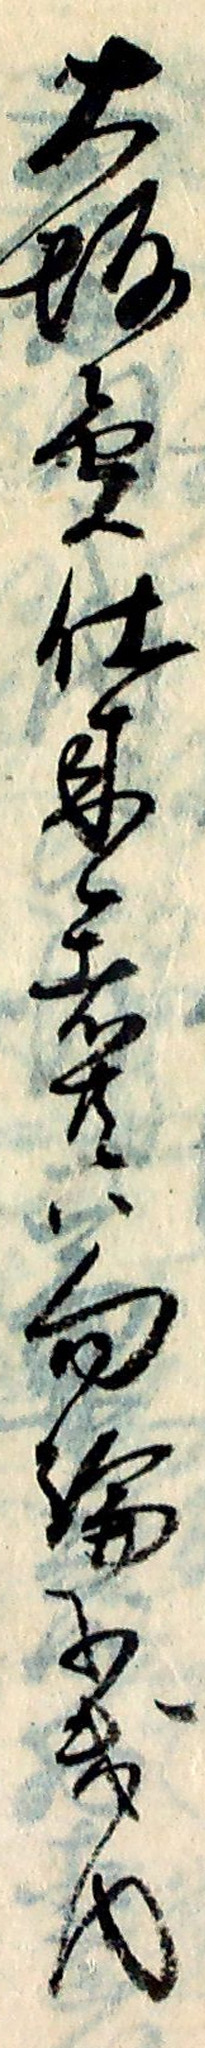大坂売仕来候者共は勿論五畿内
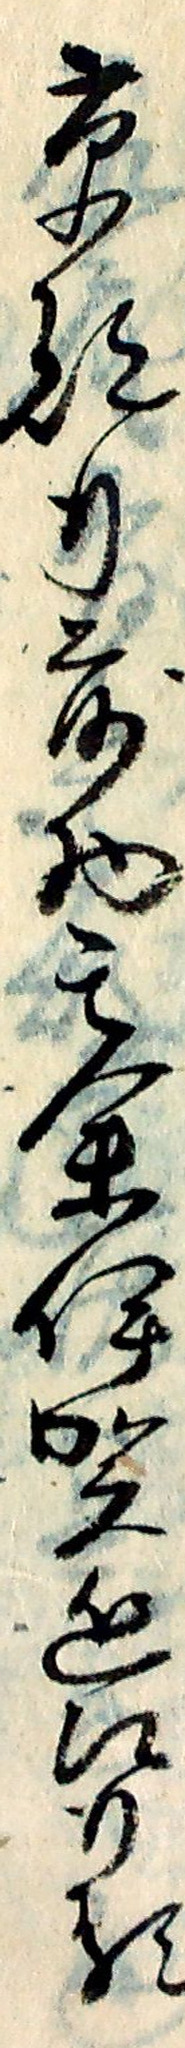京都行荷物其余伊賀近江行類
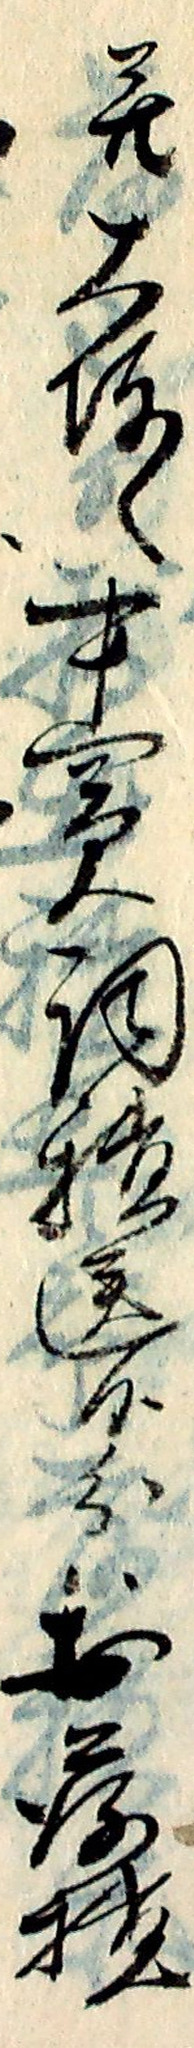并大坂へ中買調積送候分は於荷積
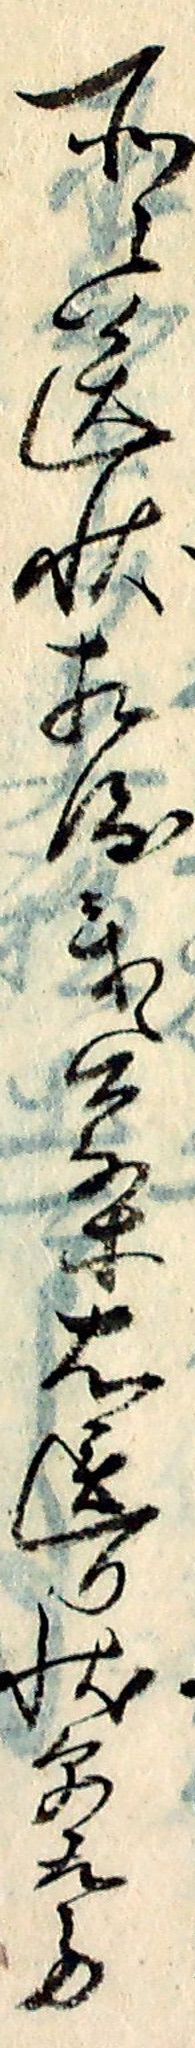所に送状相渡義に候条右送り状受取方
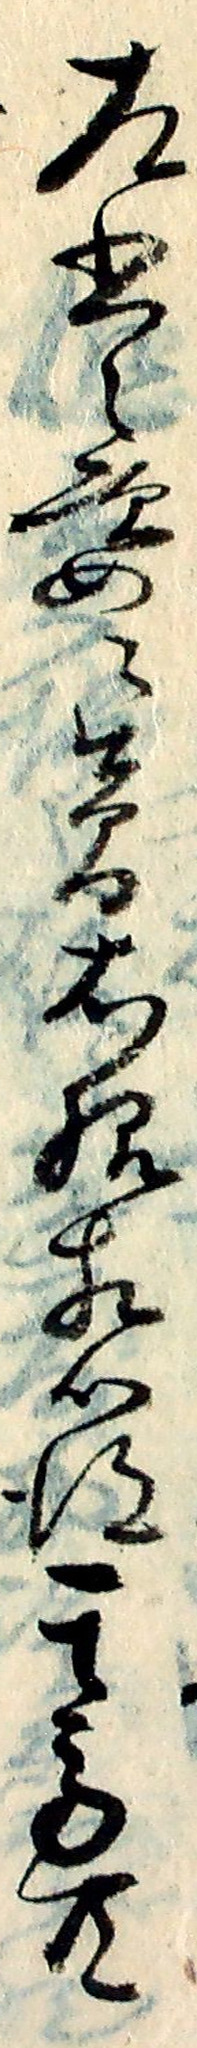左書之姿に候間右様相心得其方共
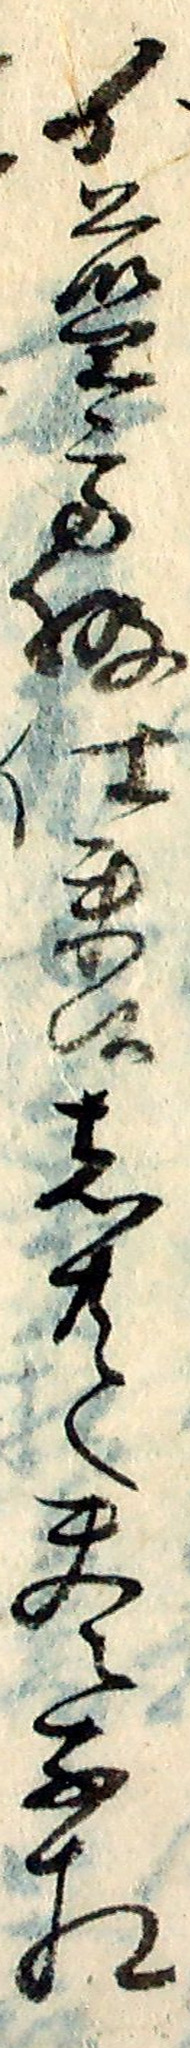ゟ藍方扱仕来候者共へ夫々不相
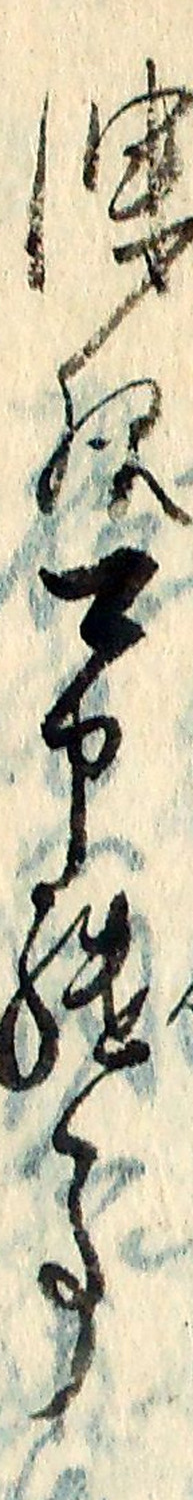洩様可申継事
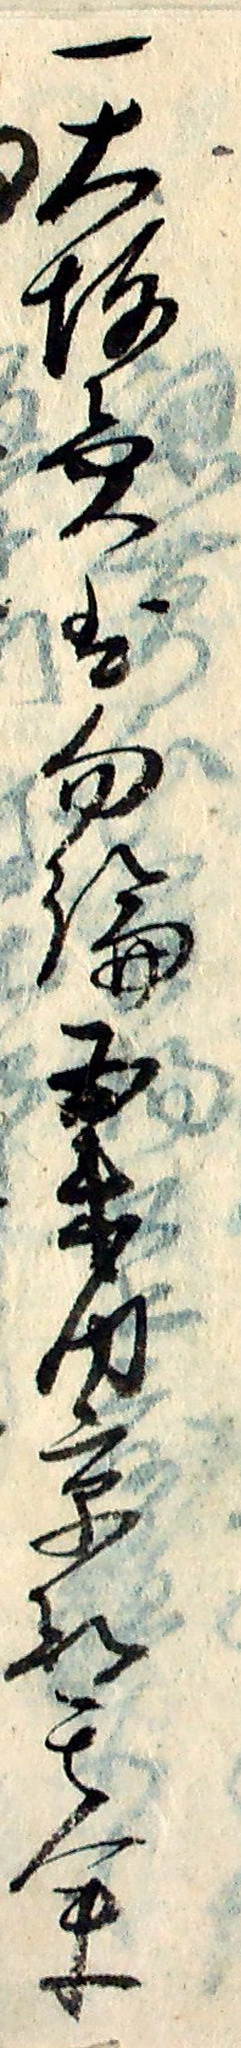一大坂売は勿論五畿内京都其余
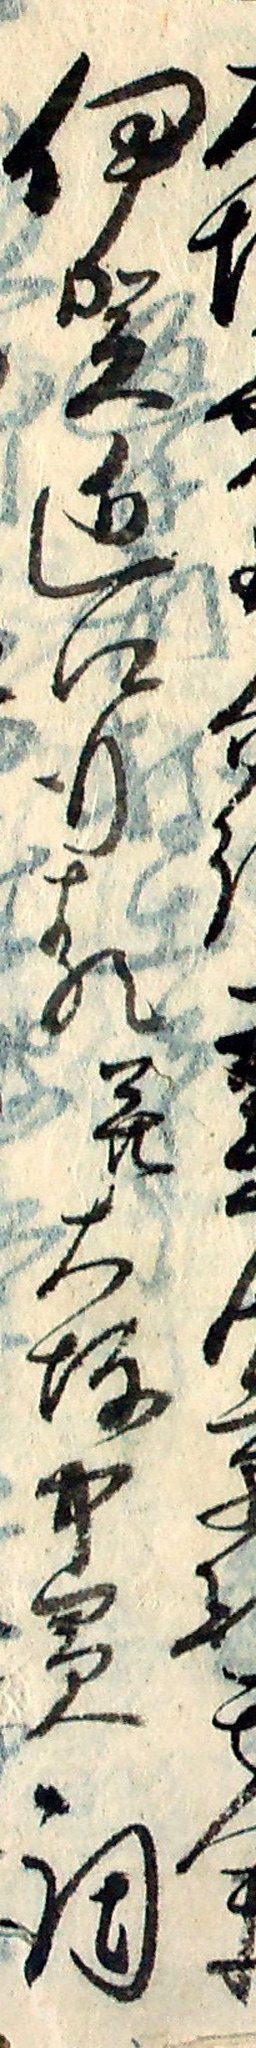伊賀近江行類并大坂中買調
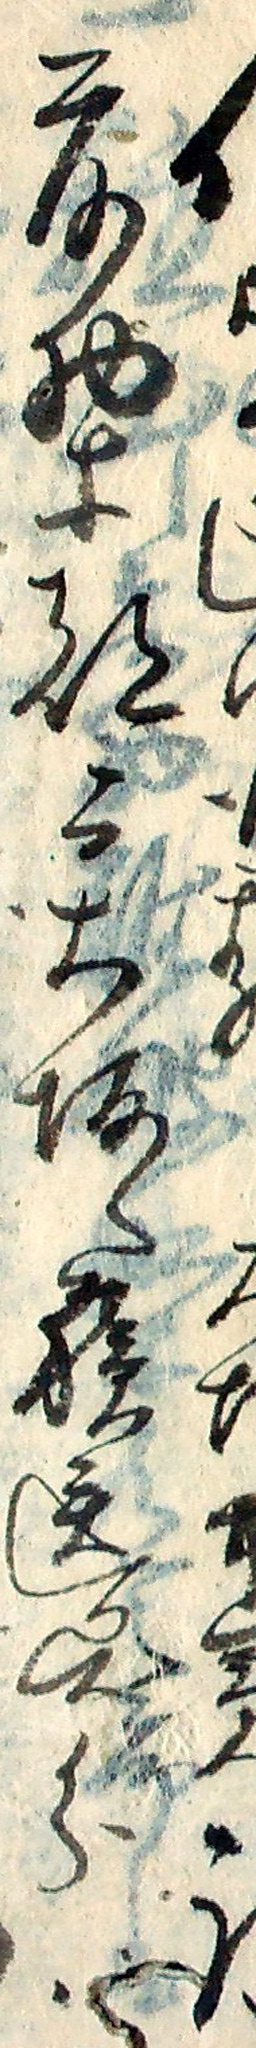荷物等都て大坂へ積送り候分は
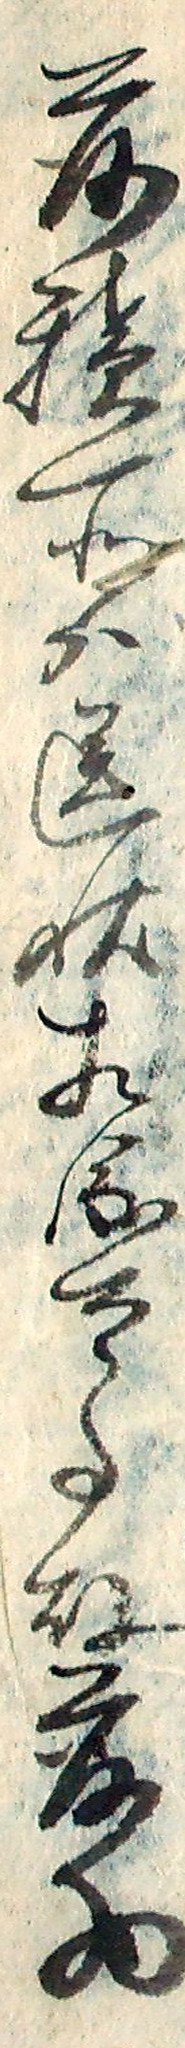荷積所ゟ送状相添候事故荷物

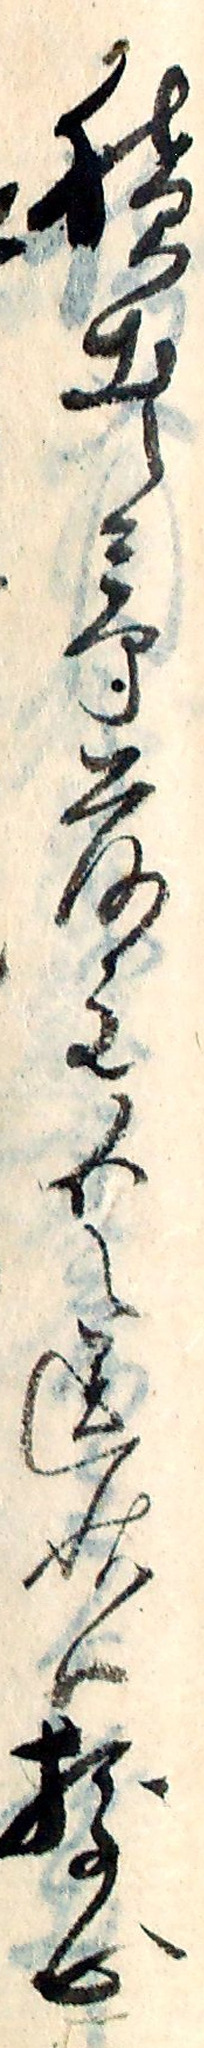積出之節荷主ゟ之送状は指出
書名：諸御願書控(後藤氏壱番）
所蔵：鳴門教育大学 Naruto University of Education
